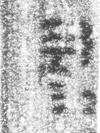{石至}
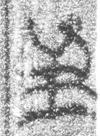皇
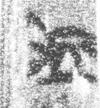○（俎）
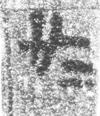廿
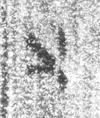又
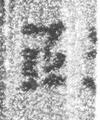五
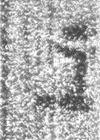○（俎）
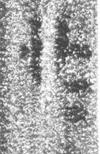廿
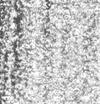又
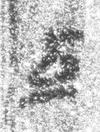五
